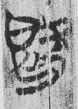既
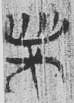本B（本）
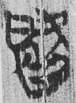既
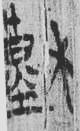槿（根）
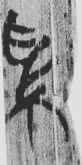○（奚）
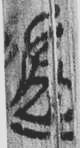○（後）
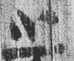之
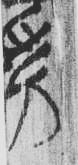○（奚）
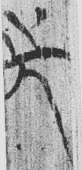先
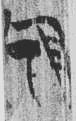侌（陰）
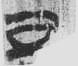昜（陽）
